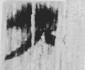大（太）
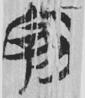○（宰）
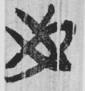我
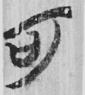可（何）
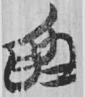爲
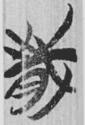歲（歲）
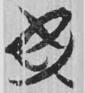𡚦（焉）
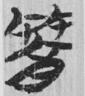○（熟）
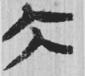大（太）
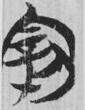○（宰）
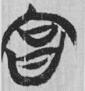○（答）
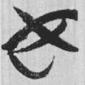女（如）
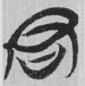君
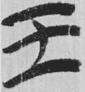王
